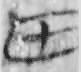甲
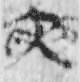寅
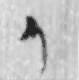人
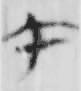午
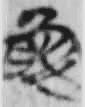婁
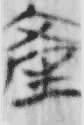產
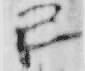己
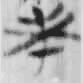未
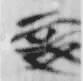妾
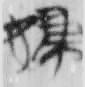婦
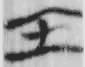壬
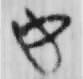女
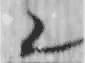乙
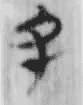丑
